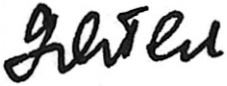дятел
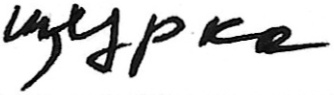щурка
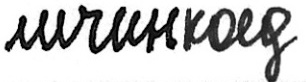личинкоед
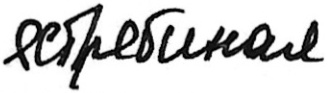ястребиная
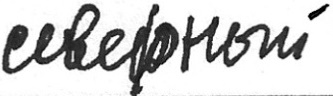северный
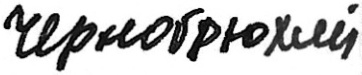чернобрюхий
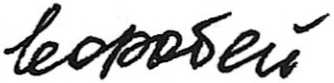воробей
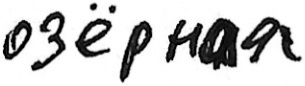озёрная
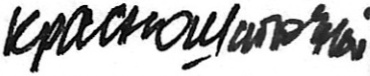красношапочны
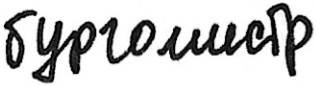бургомистр
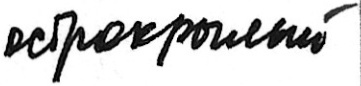острокрылый
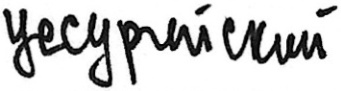уссурийский
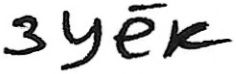зуёк
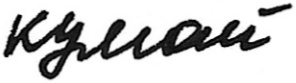кумай
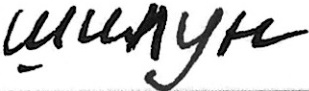шипун
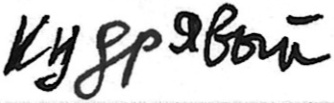кудрявый
